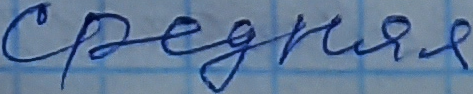средняя
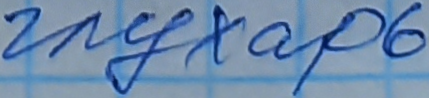глухарь
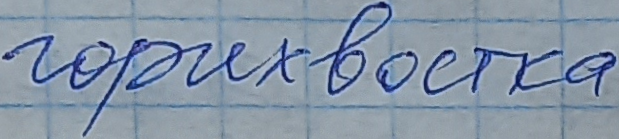горихвостка
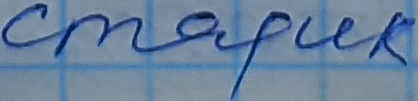старик
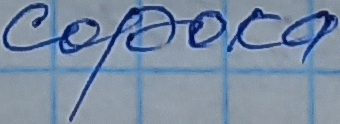сорока
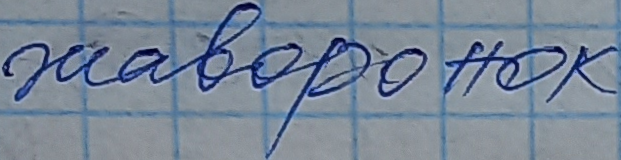жаворонок
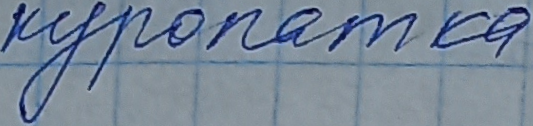куропатка
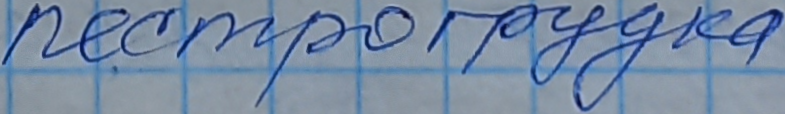пестрогрудка
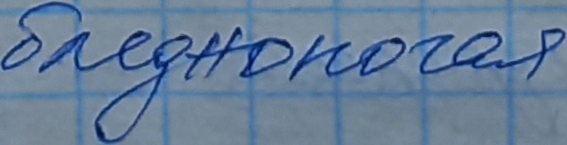бледноногая
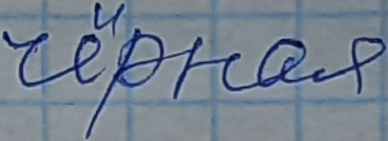чёрная
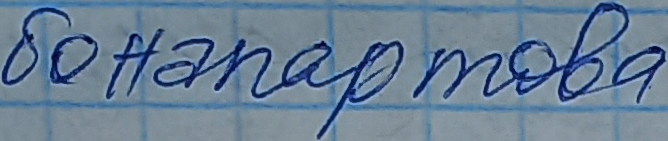бонапартова
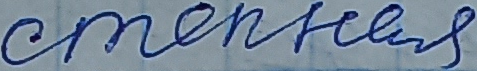степная
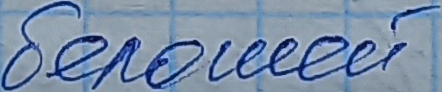белошей
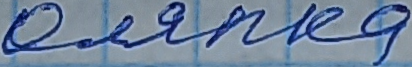оляпка
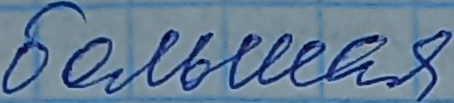большая
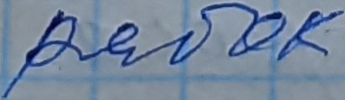рябок
